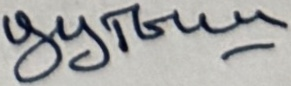дутыш
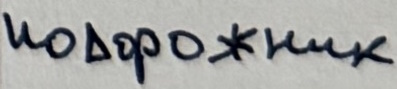подорожник
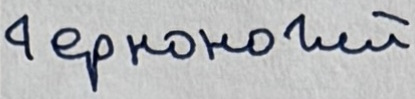черноногий
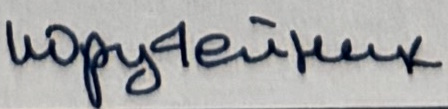поручейник
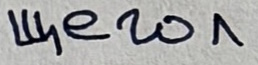щегол
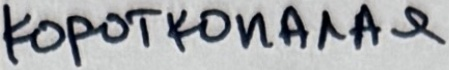короткопалая
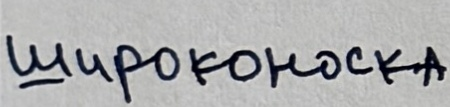широконоска
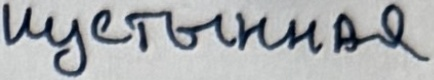пустынная
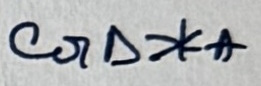сыджа
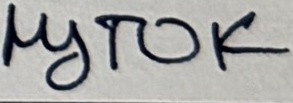луток
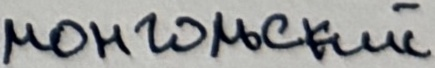монгольский
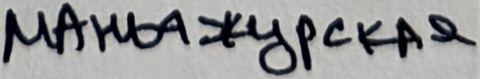маньчжурская
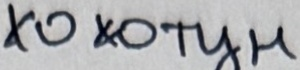хохотун
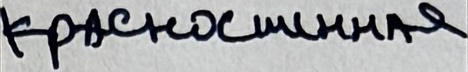красноспинная
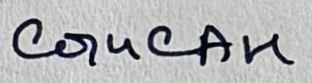сапсан
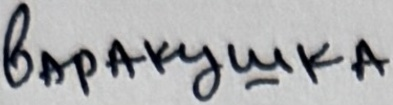варакушка
